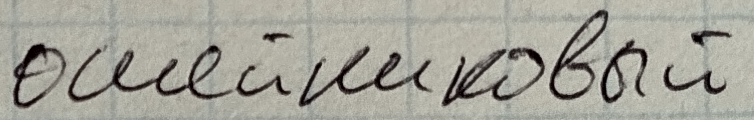ошейниковый
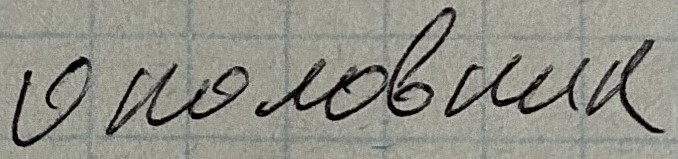ополовник
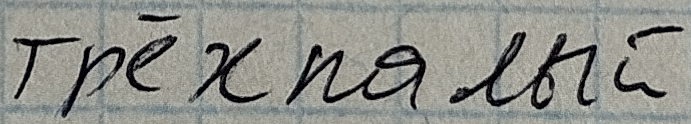трёхпалый
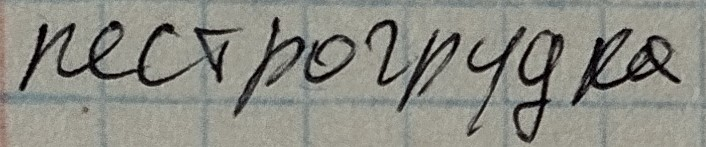пестрогрудка
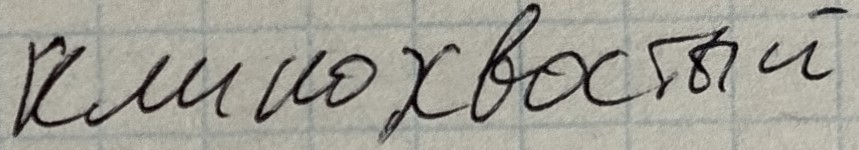клинохвостый
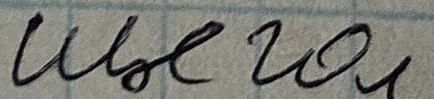щегол
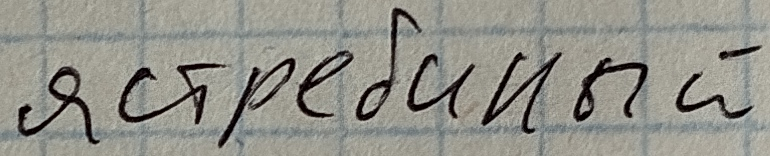ястребиный
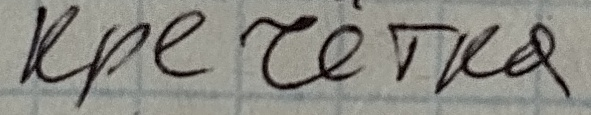кречётка
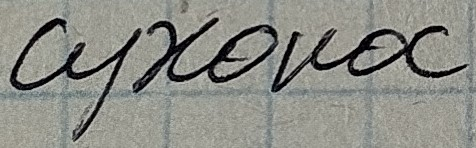сухонос
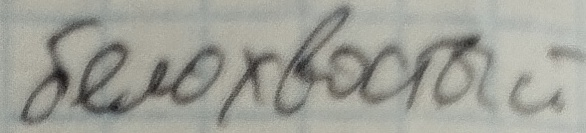белохвостый
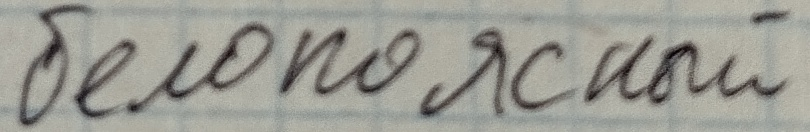белопоясный
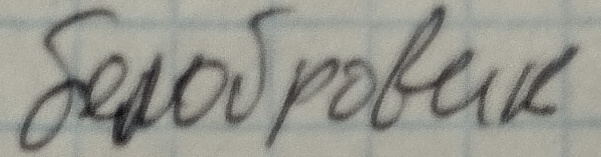белобровик
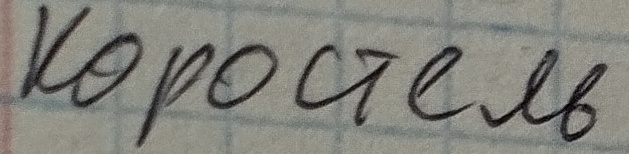коростель
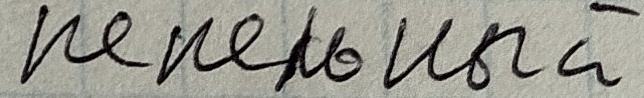пепельный
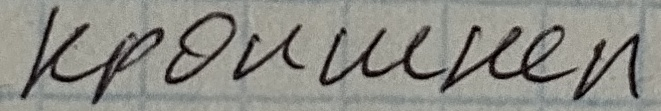кроншнеп
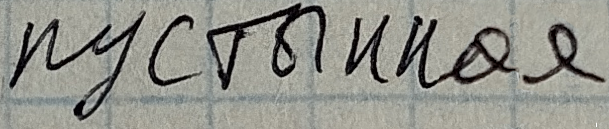пустынная
